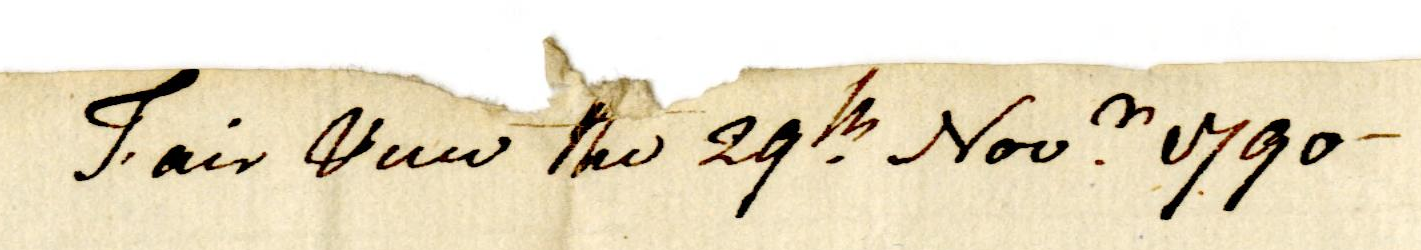Fairview the 29^th Nov^r. 1790-
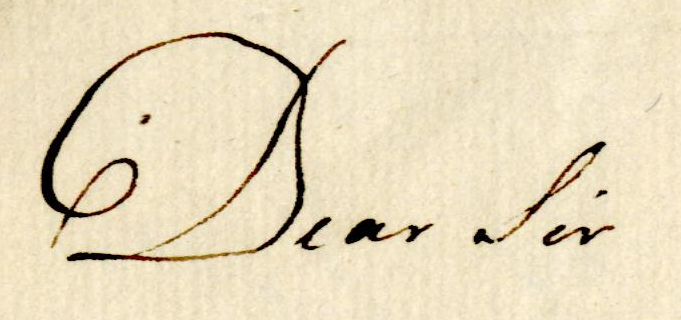Dear Sir
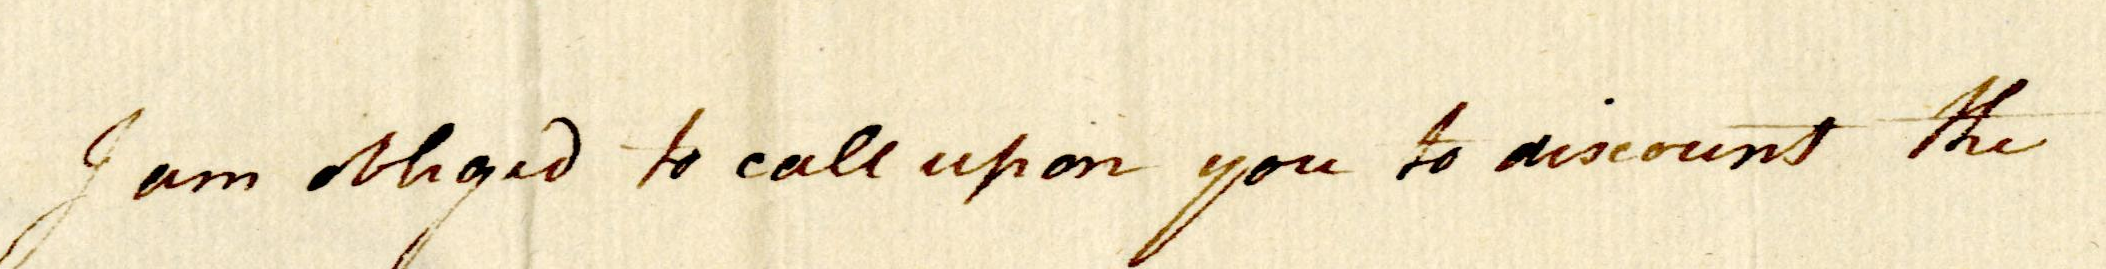I am obliged to call upon you to discount the
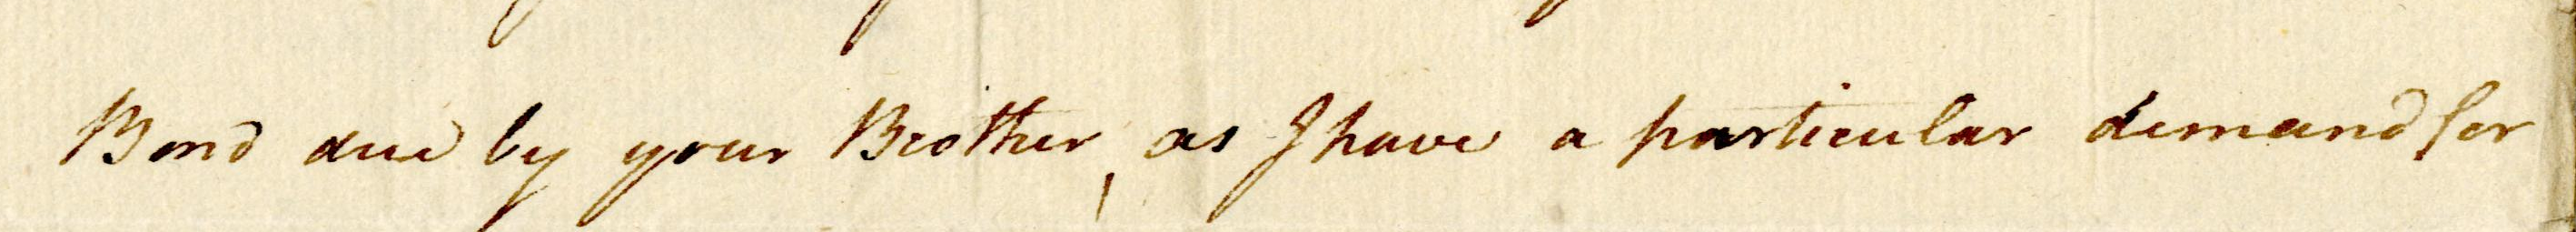Bond done by your Brother, as I have a particular demand for
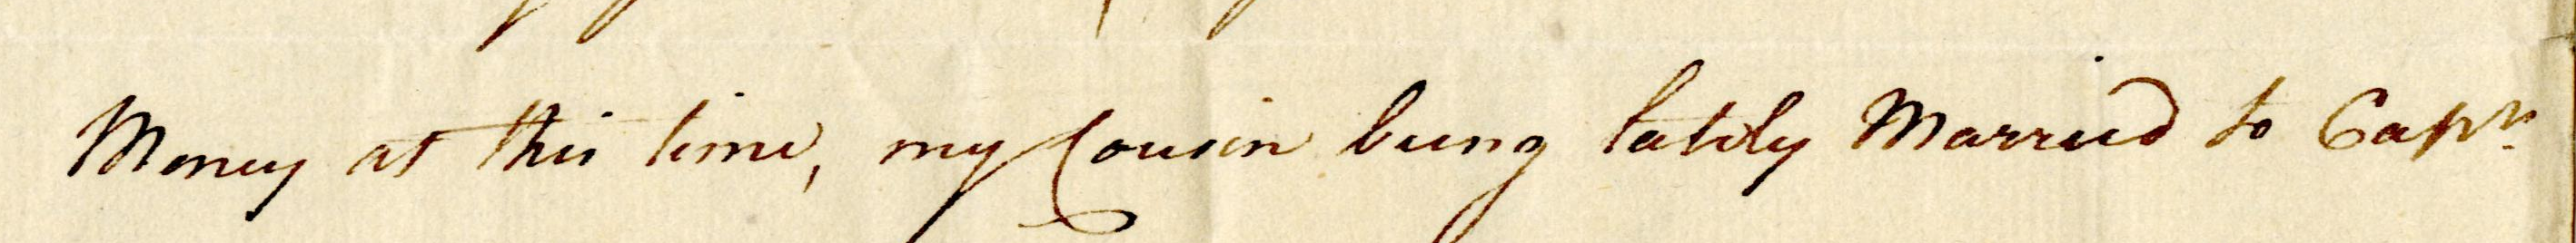Money at this time, my Cousin being lately Married to Cap^t.
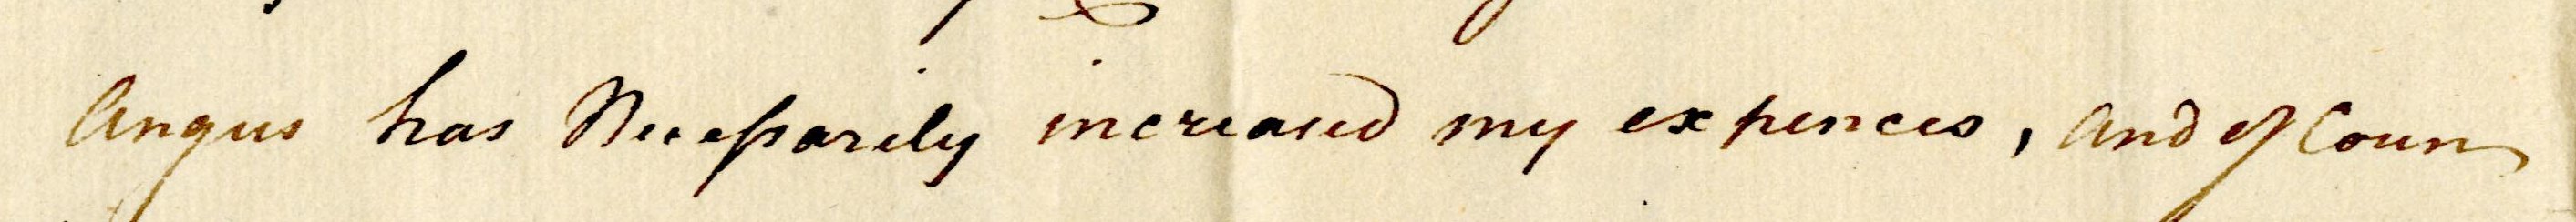Angus has necessarily increased my expenses, and of Course
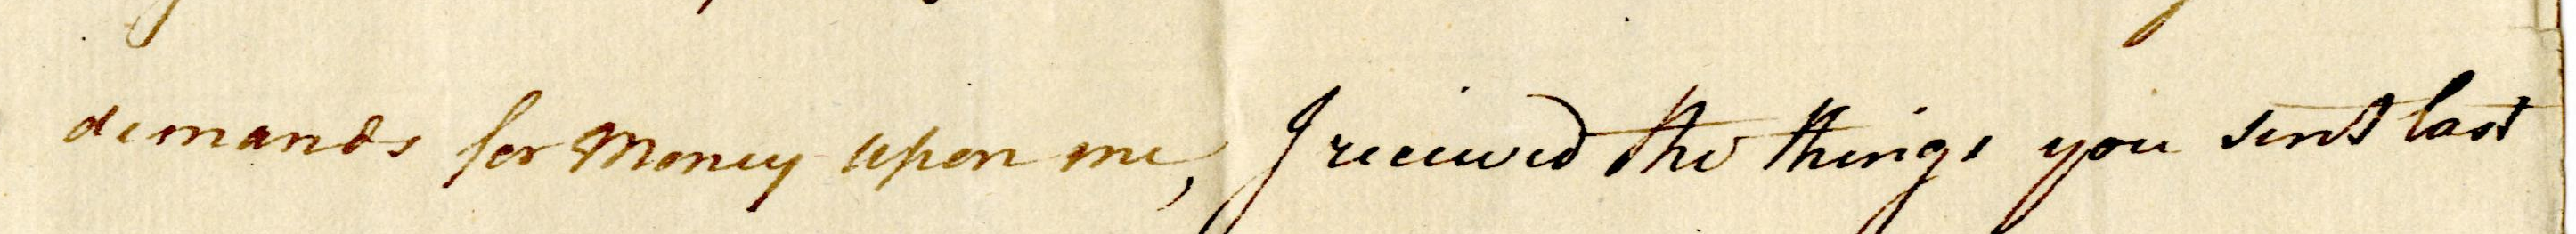demands for Money upon me, I received the things you sent last
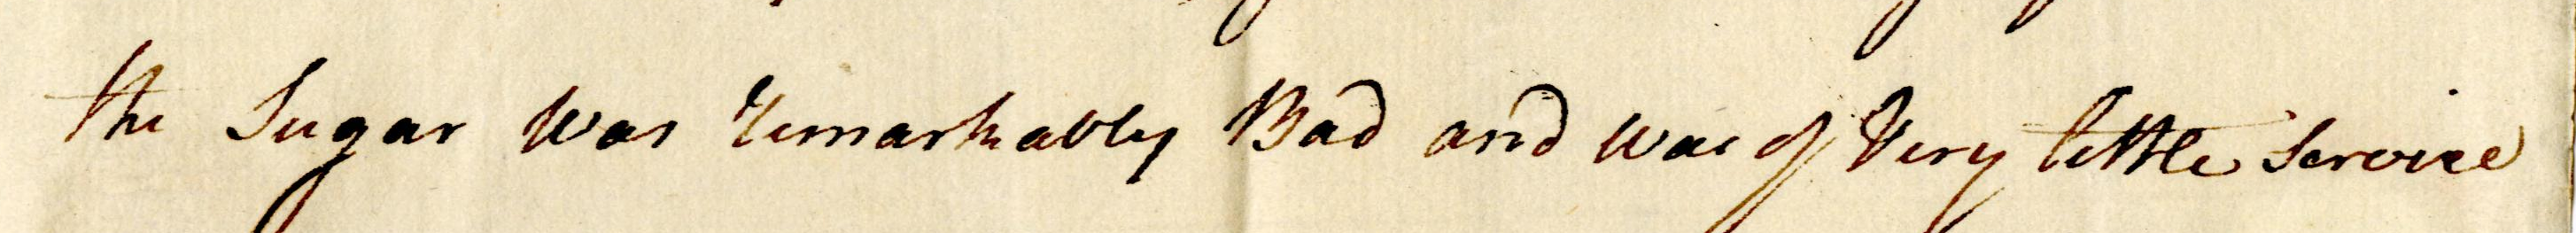the Sugar Was remarkably Bad and was of Very little service
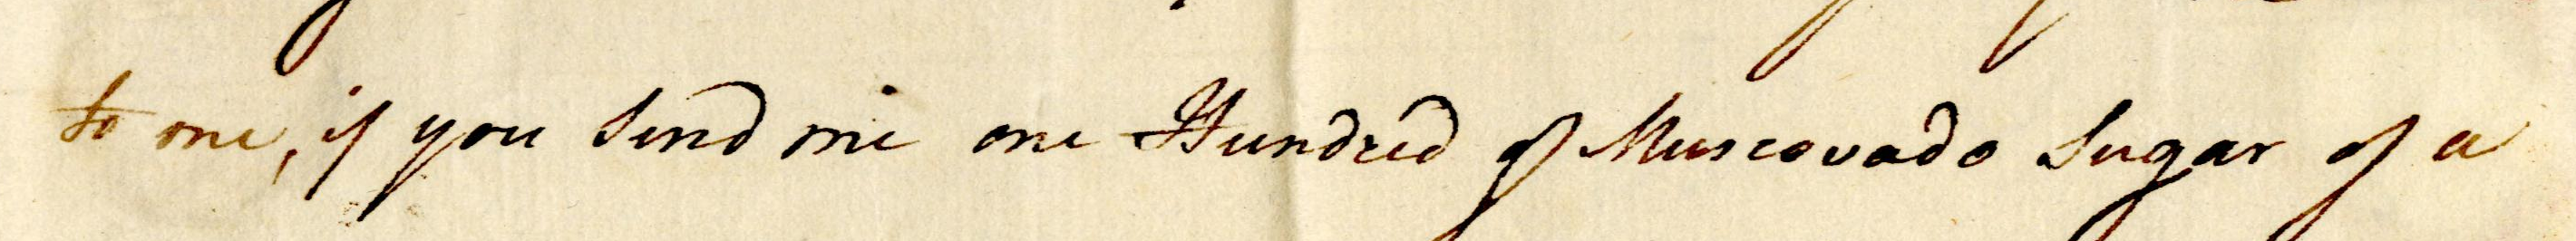to me, if you send me one Hundred of Muscavado Sugar of a
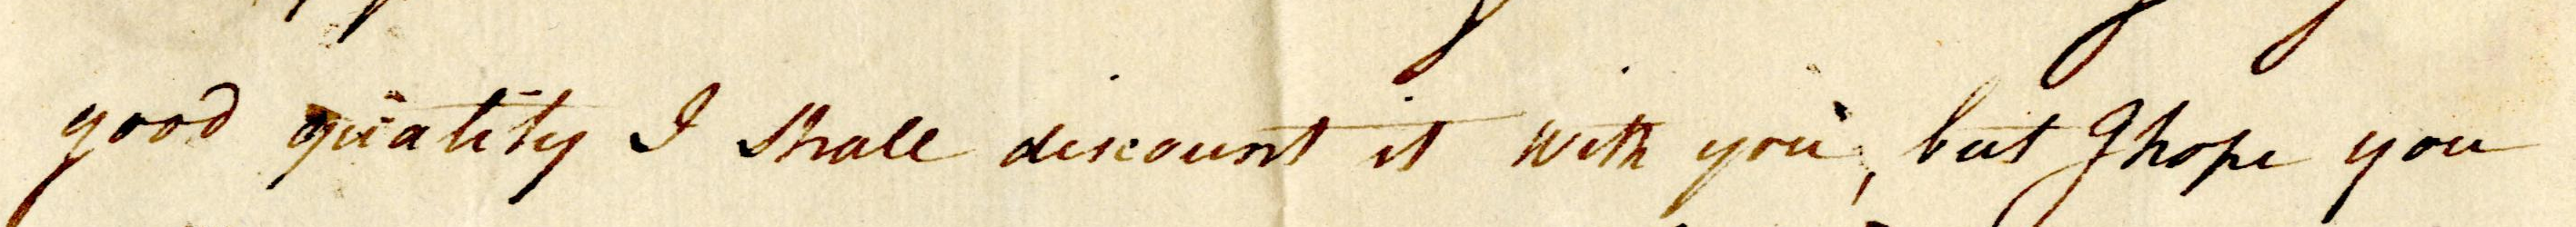good quality I shall discount it with you, but I hope you
